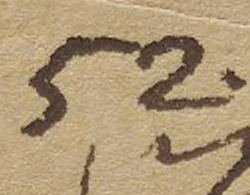52
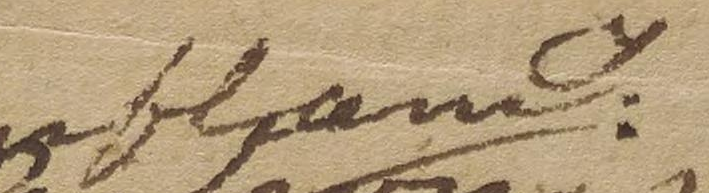inflam^y
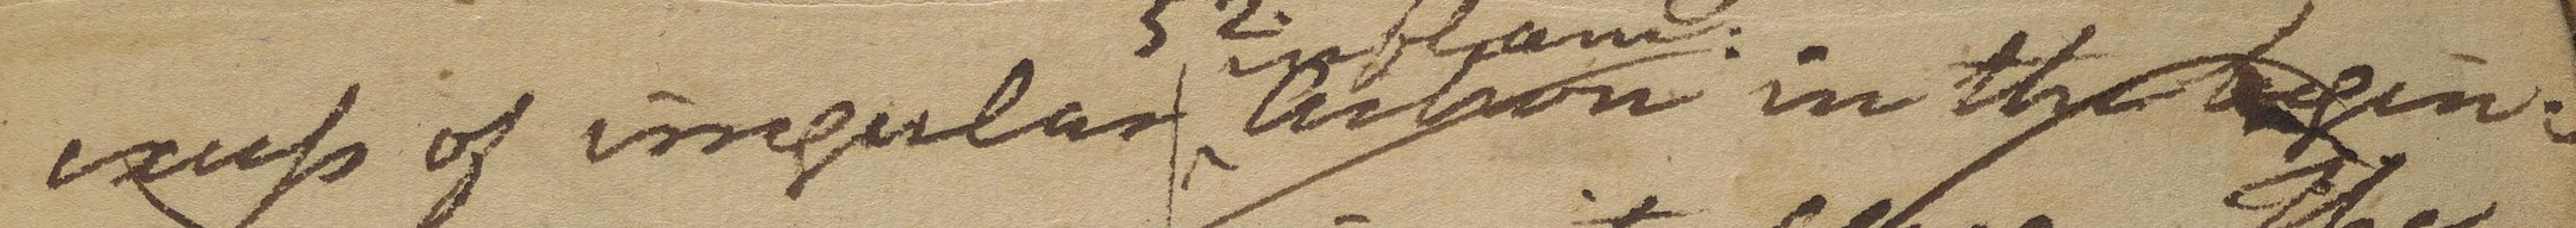excess of irregular ^ action in the begin-
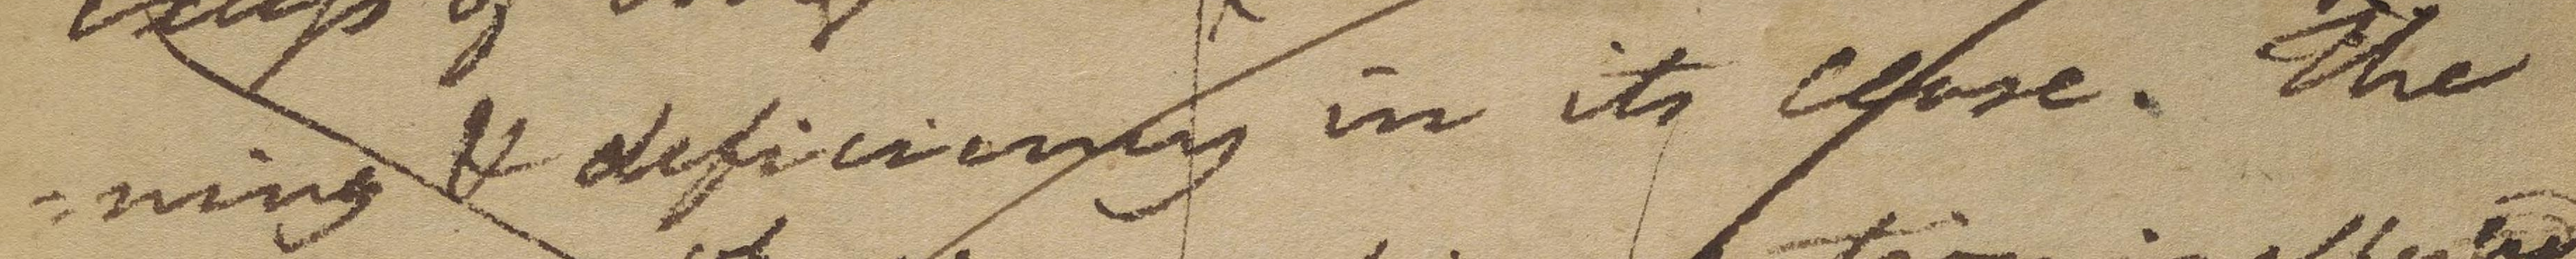-ning & deficiency in its close. The
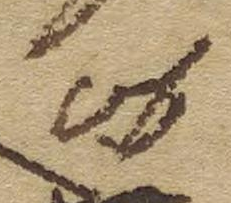of
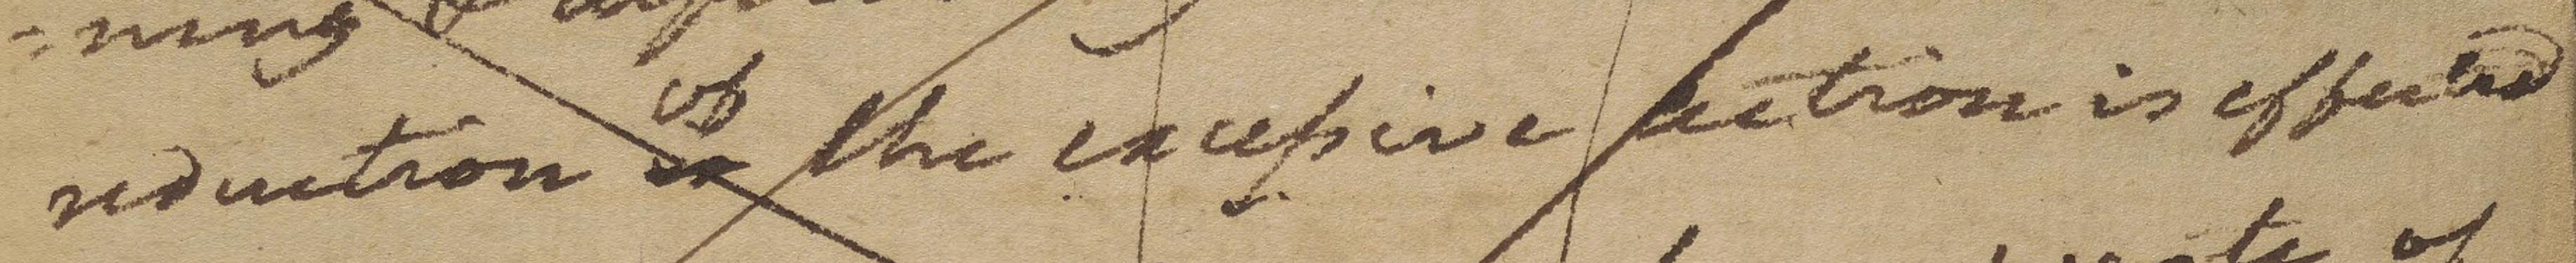reduction of the excessive action is effected
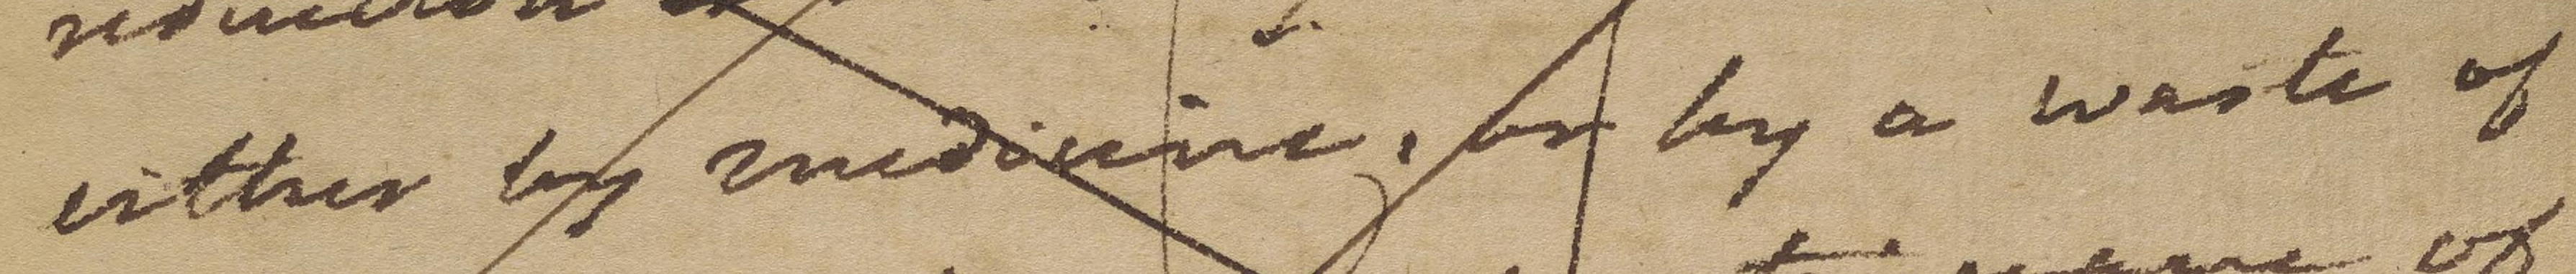either by medicine, or by a waste of
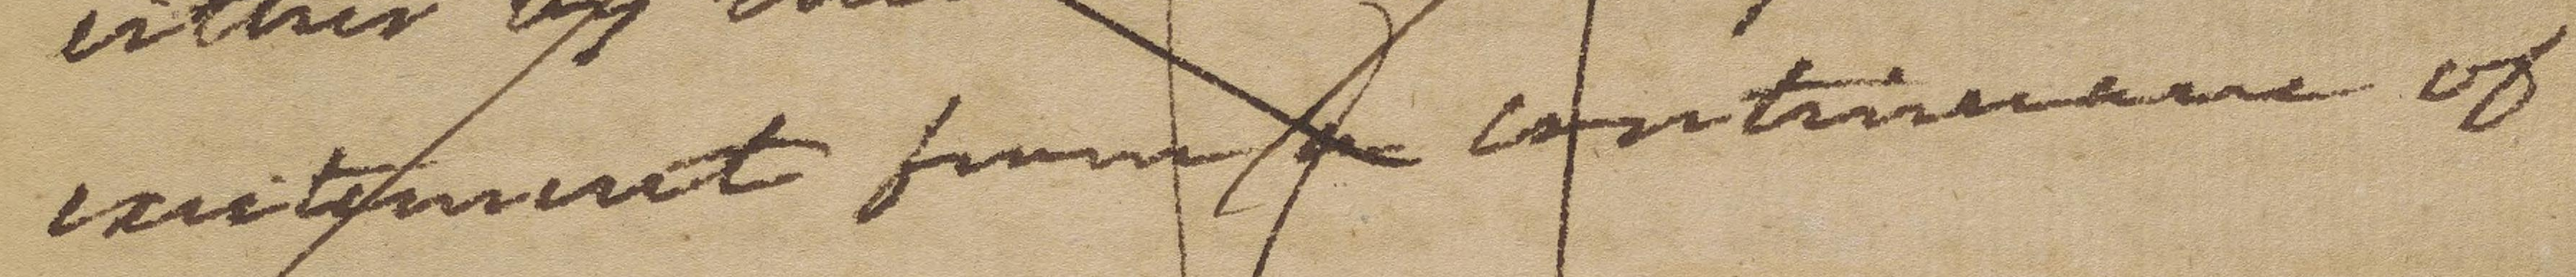excitement from a continuance of
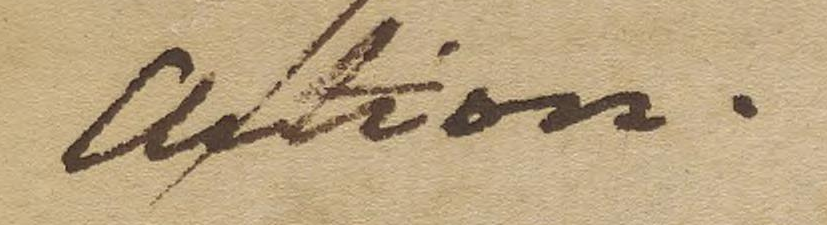Action.
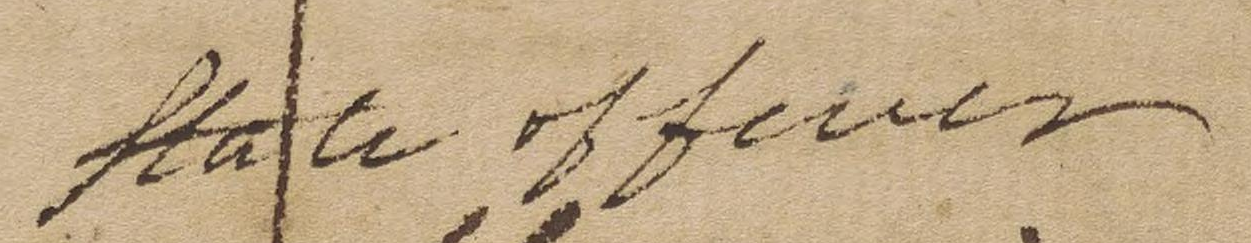state of fever
